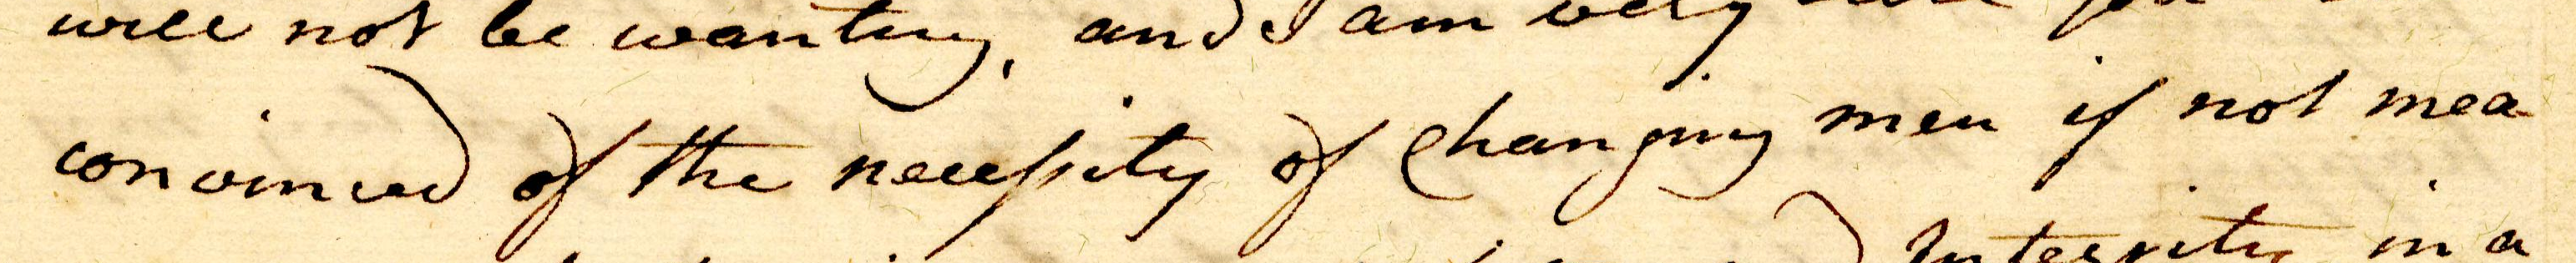convinced of the necessity of Changing men if not mea-
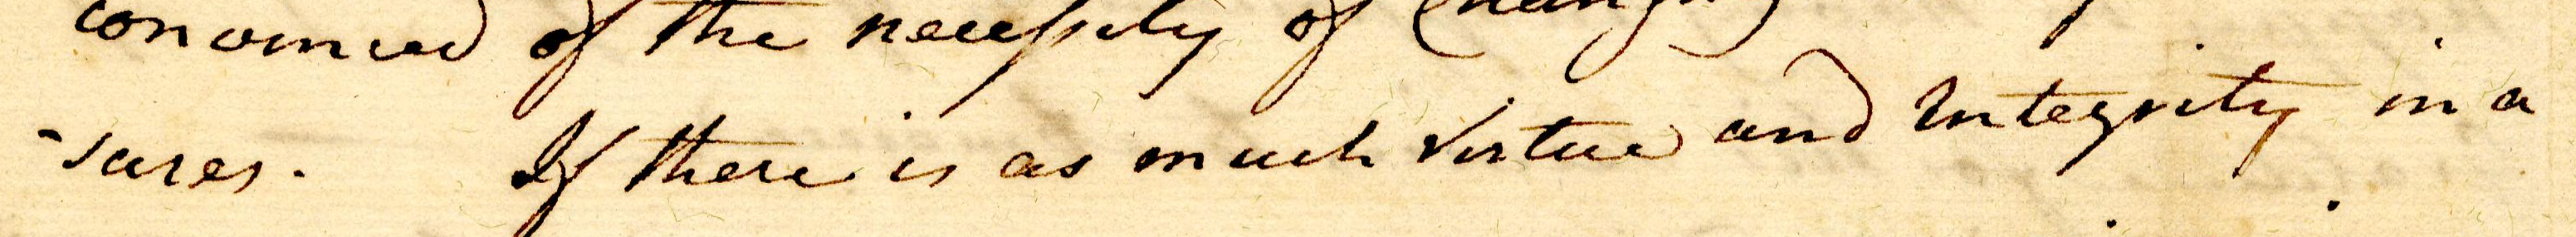-sures. If there is as much virtue and Integrity in a
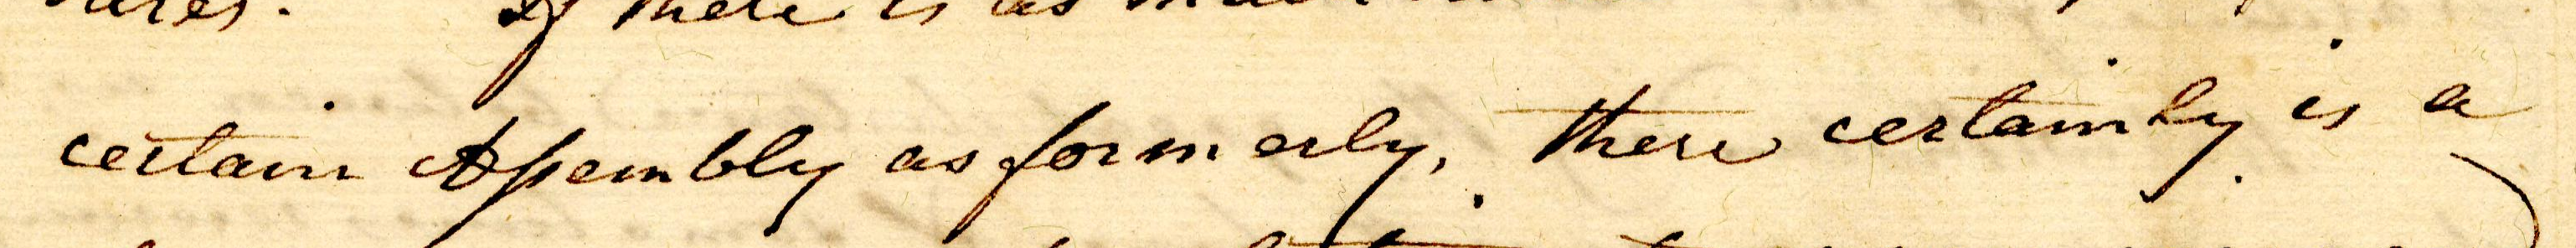certain Assembly as formerly, there certainly is a
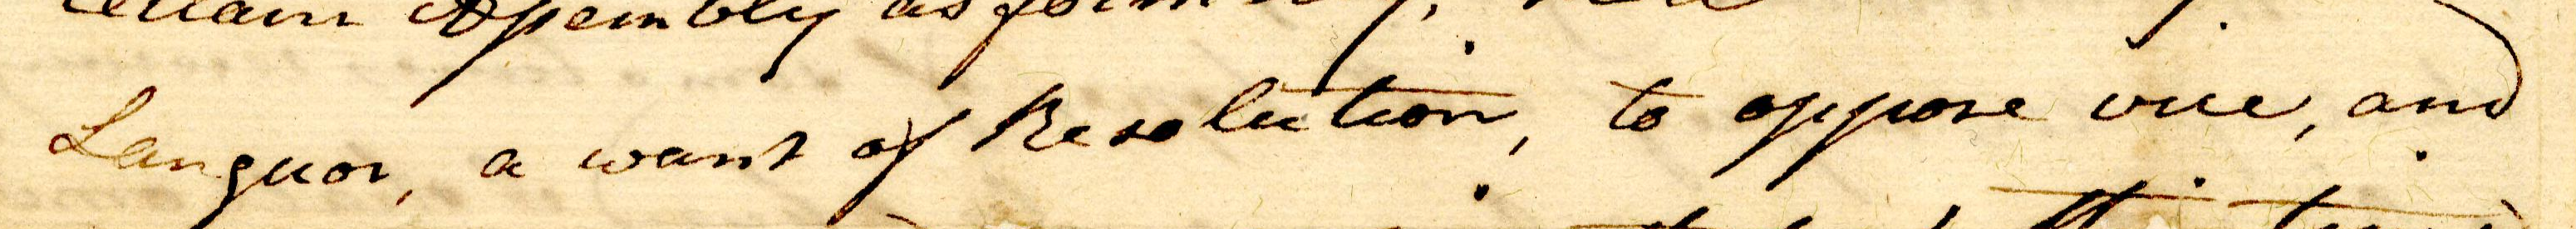Languor, a want of Resolution, to oppose vice, and
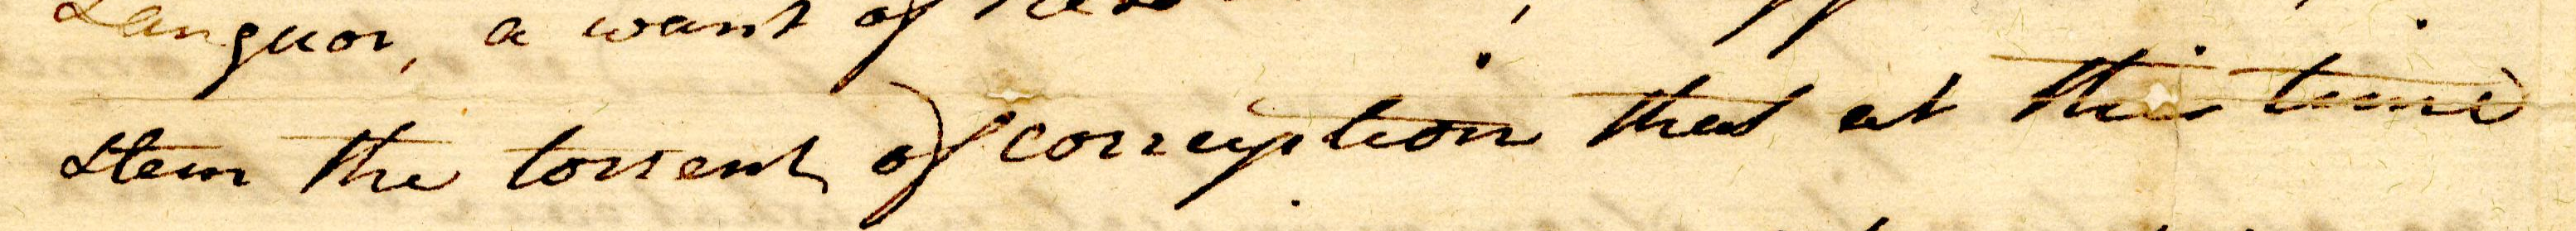often the torrent of conception that at this time
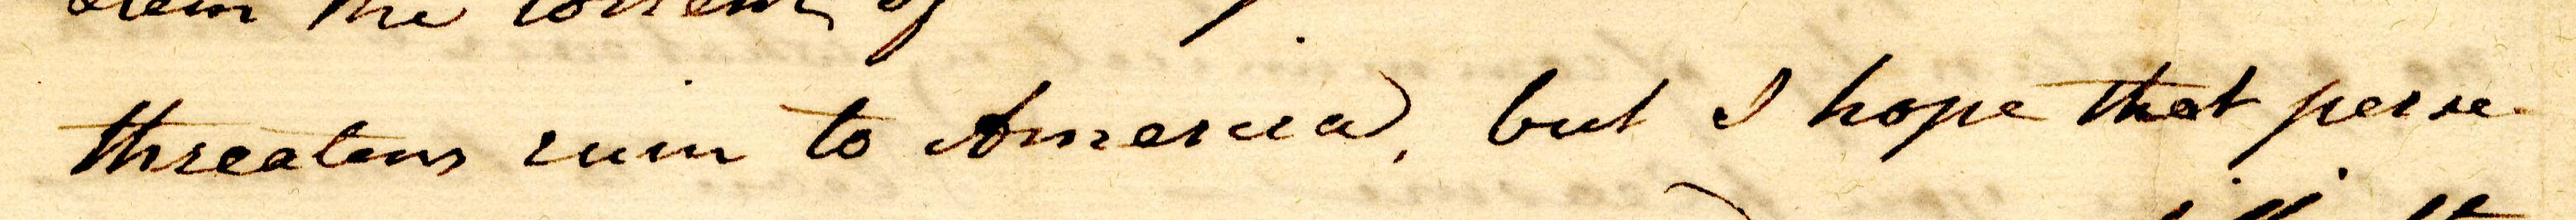threatens ruin to America, but I hope that perse-
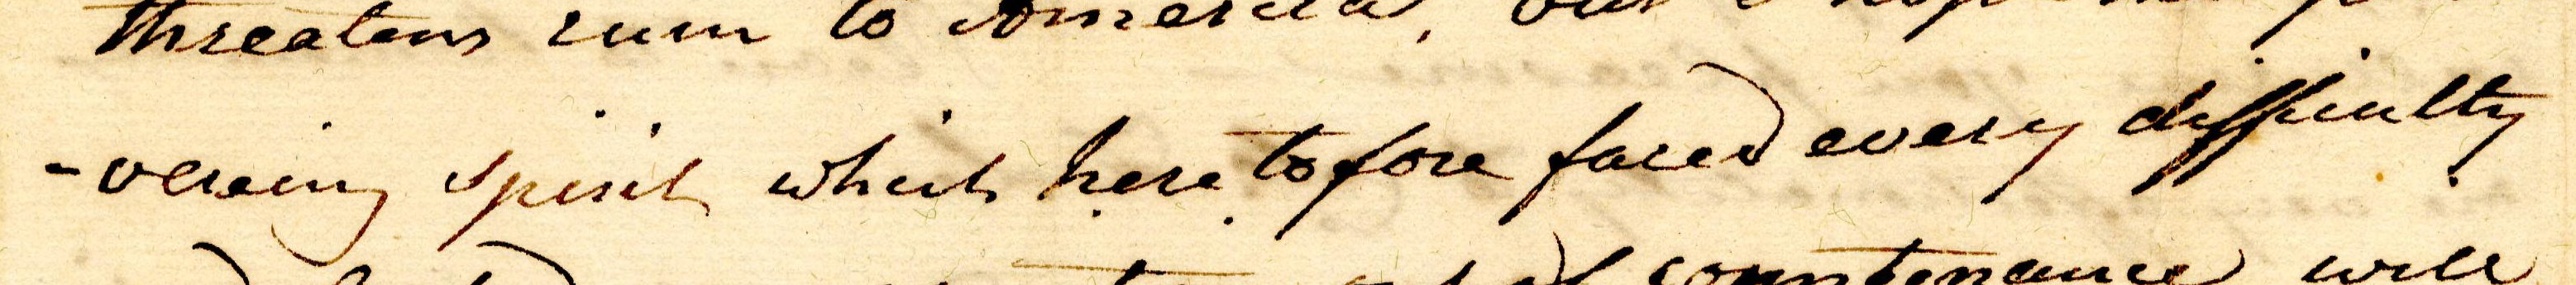-vering spent which here to fore faced every difficulty
